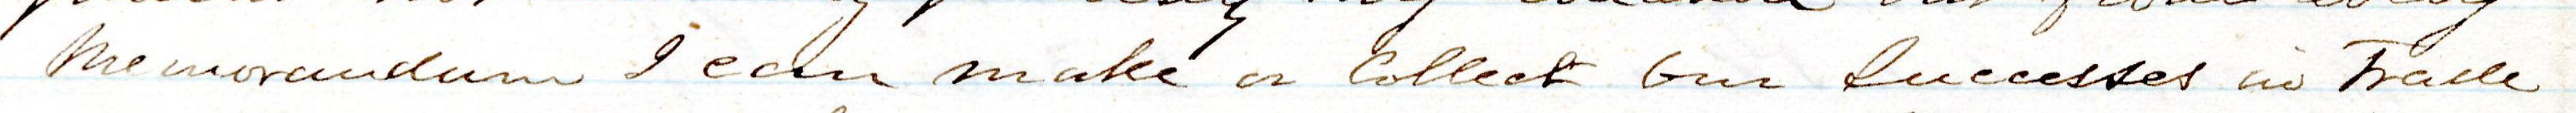memorandum I can make or collect our successful as Trade
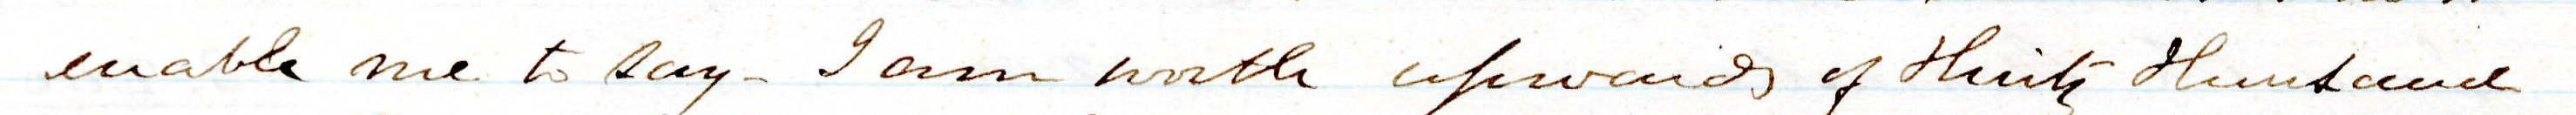enable me to say- I am with upwards of thirty Hundred
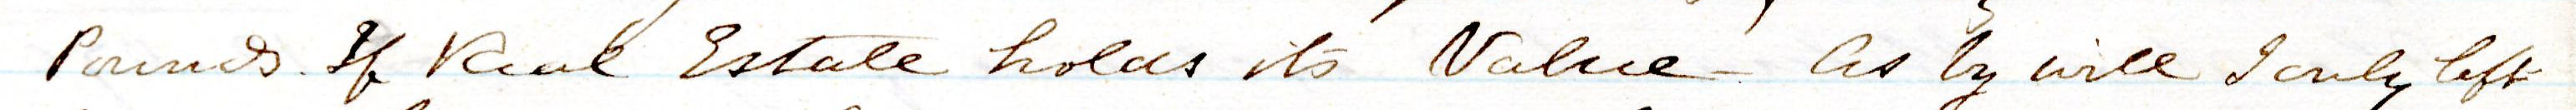pounds If Real Estate holds its Value- As by will I only left
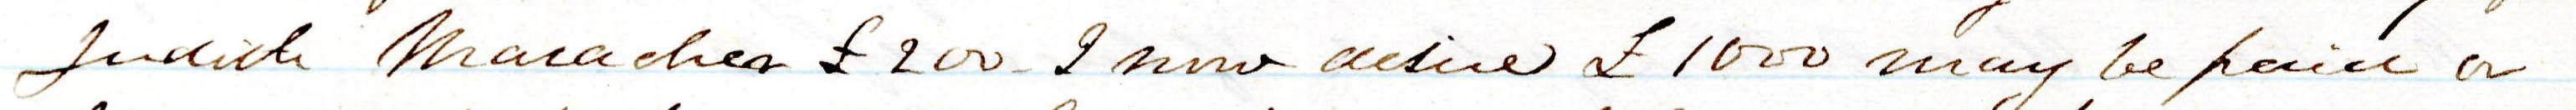Judith Maracher £200. I now desire £1000 may be paid as
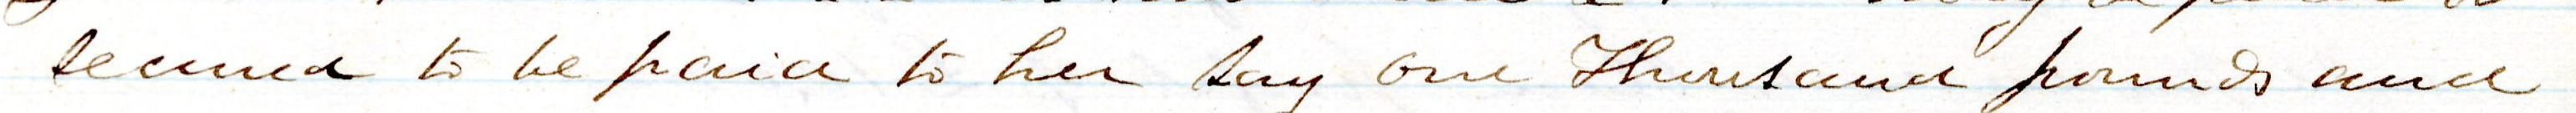secured to be paid to her say one thousand pounds and
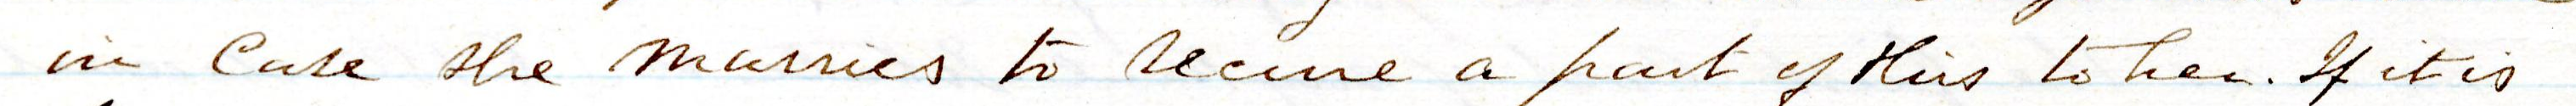in case she marries to receive a part of this to her. If it is
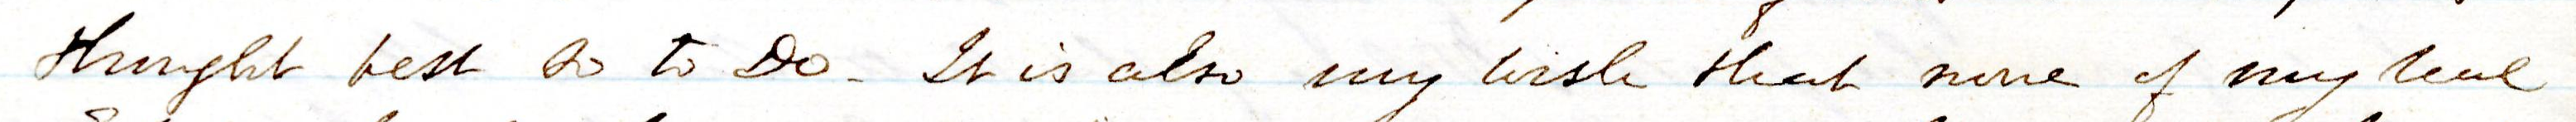thought best so to do. It is also my wish that none of my real
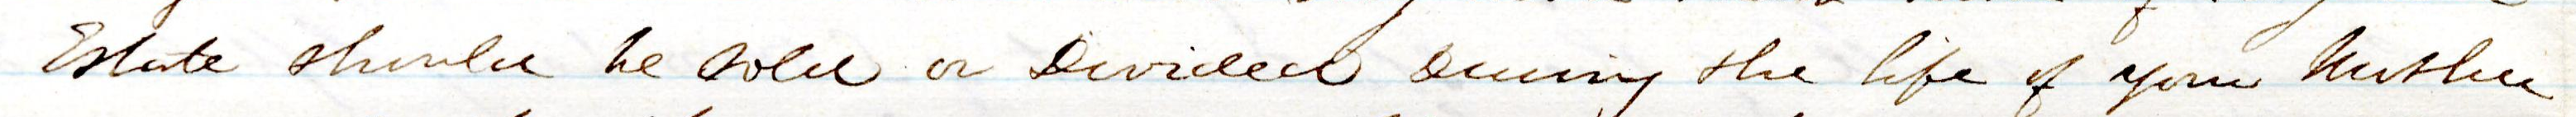Estate should be able or Divided During the life of your Mother
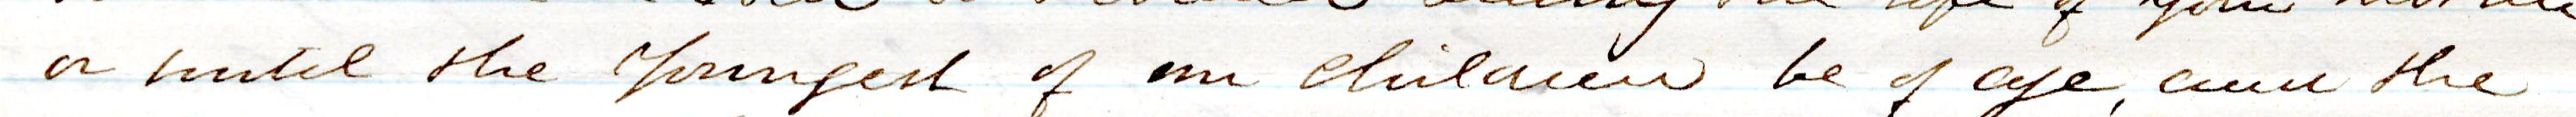or until the yourself of the children be of age, and the
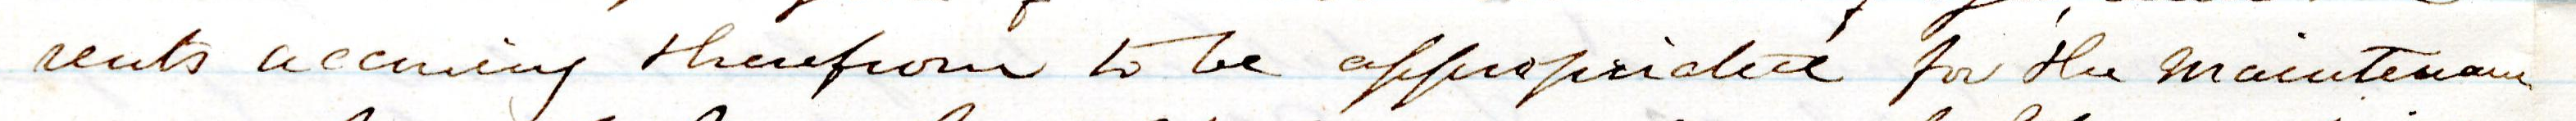rents accruing therefore to be appropriated for the maintenance
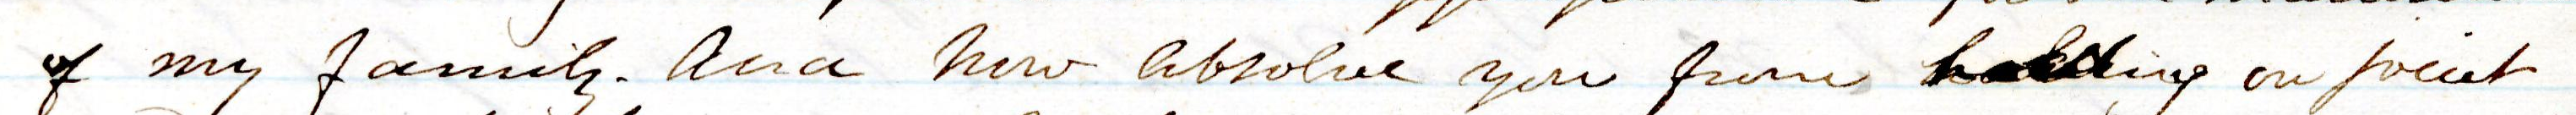of my family.- And now absolve you from holding on privet
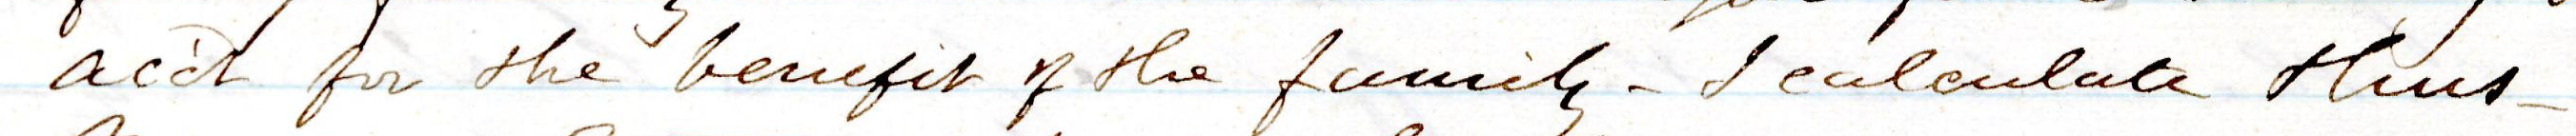acc't for the benefit of the family- I calculate thus
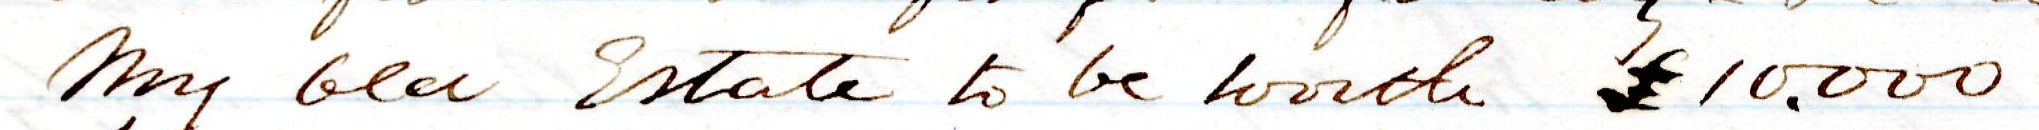My old Estate to be worth £10,000
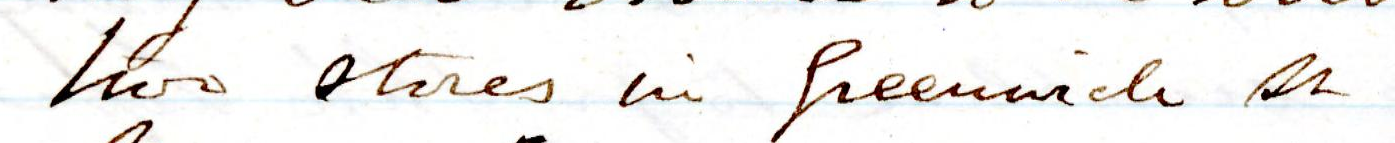his others in Greenwich st
